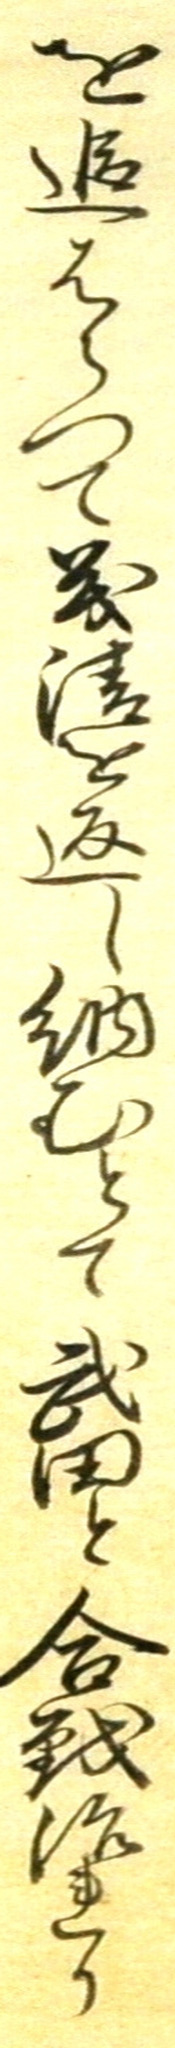を追はらつて義清を返し納むとて武田と合戦治れり
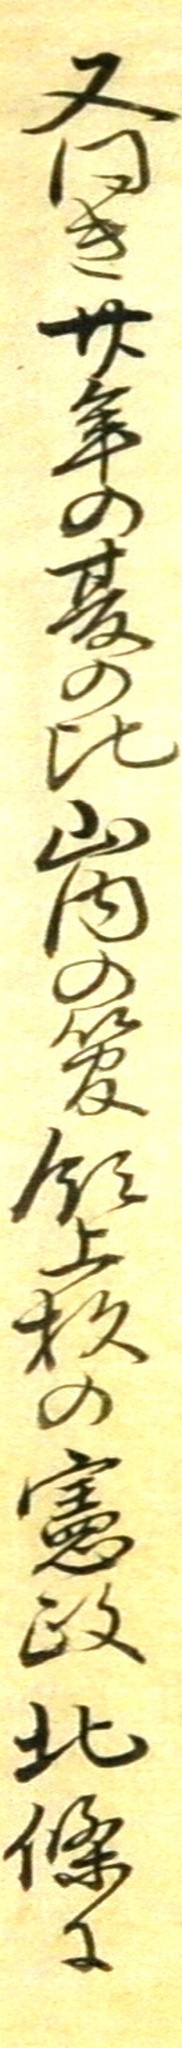又同き廿年の夏の比山内の管領上杉の憲政北条に

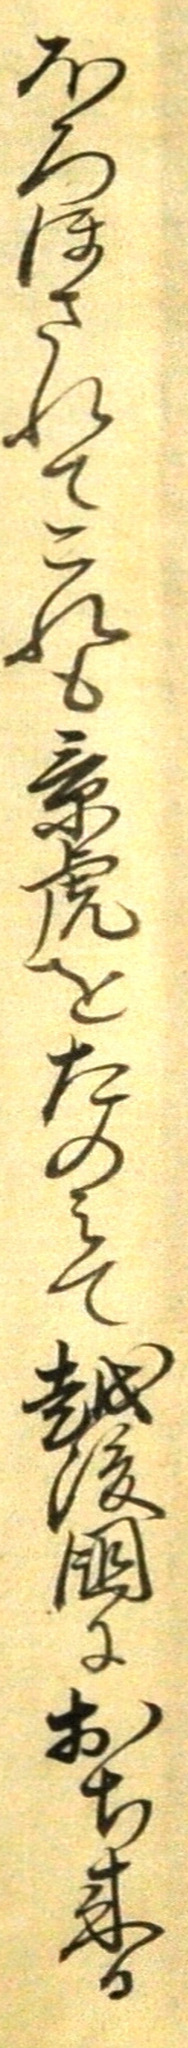ほろほされてこれも景虎をたのみて越後国におち来る
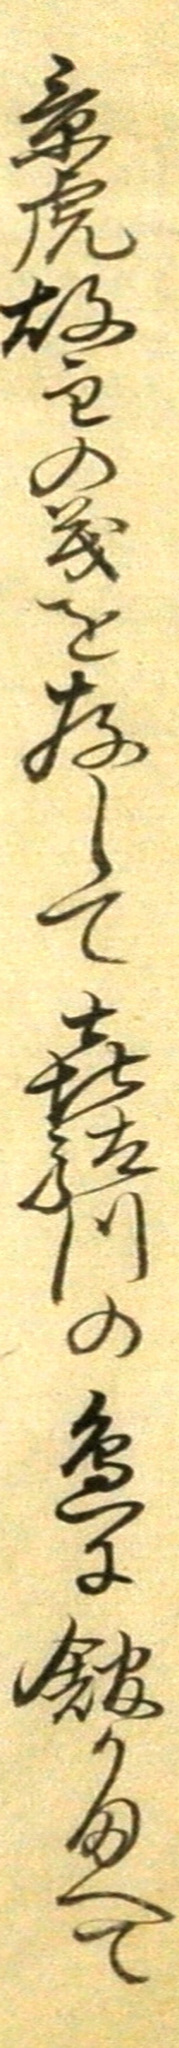景虎故主の義を存して喜駄川の辺に館かまへて
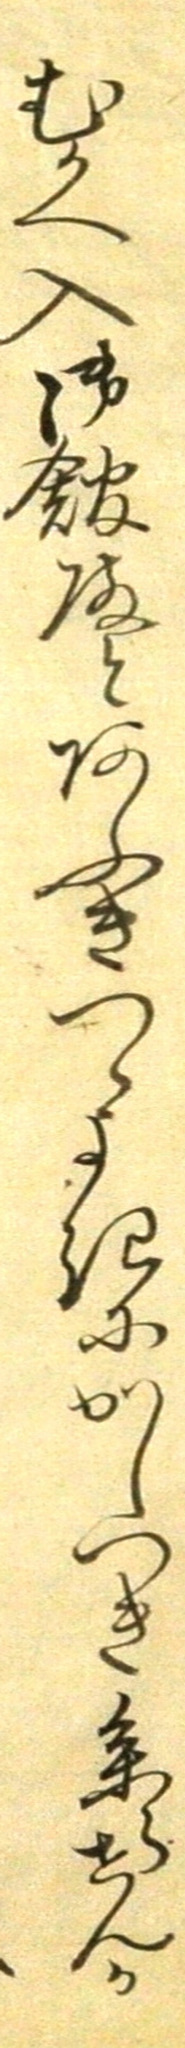むかへ入御館殿とあふきつゝよきにかしつき参らせんか
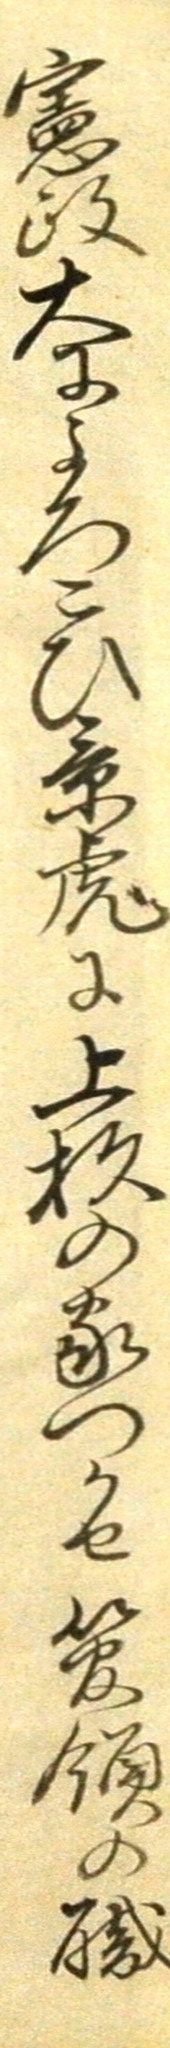憲政大によろこひ景虎に上杉の家つかせ管領の職
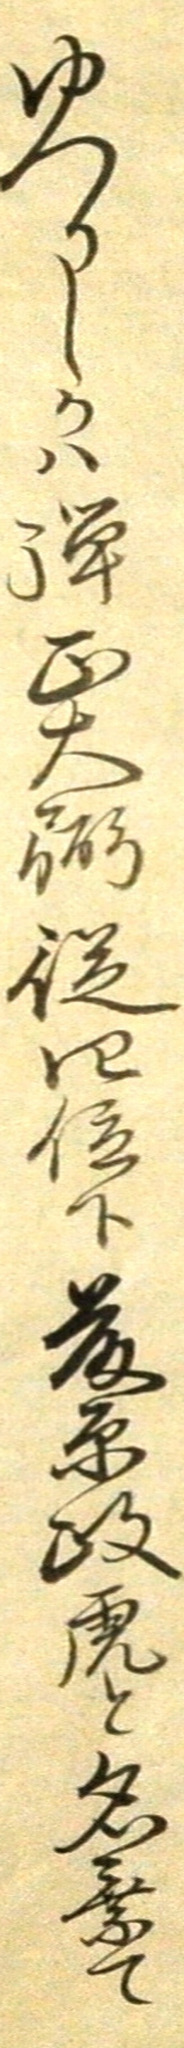ゆつりしかは弾正大弼従四位下藤原政虎と名乗て
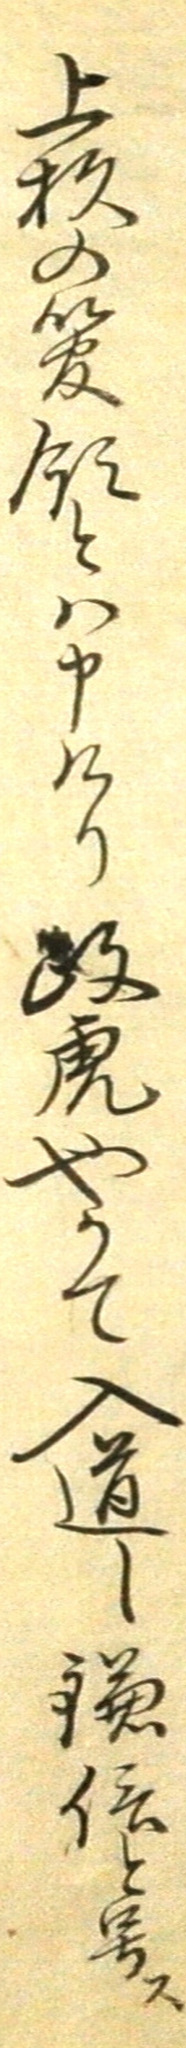上杉の管領とは申けり政虎やかて入道し謙信と号ス
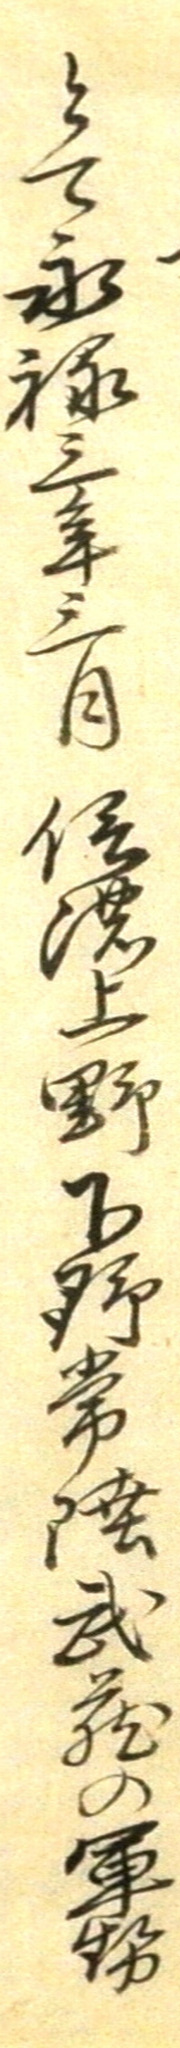とて永禄三年三月信濃上野下野常陸武蔵の軍勢
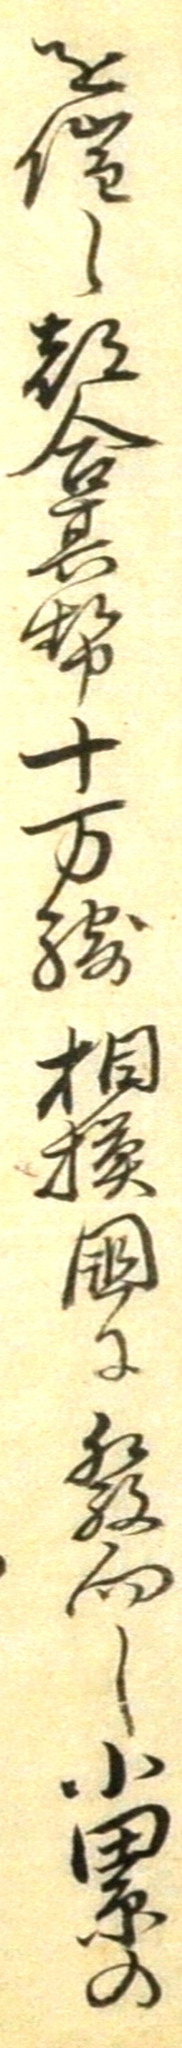を催し都合其勢十万騎相模国に発向し小田原の
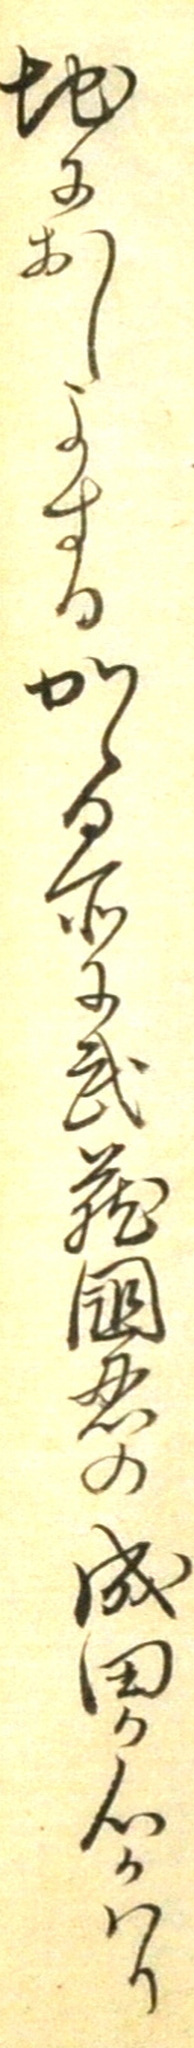地におしよするかゝる所に武蔵国忍の成田か心かはり
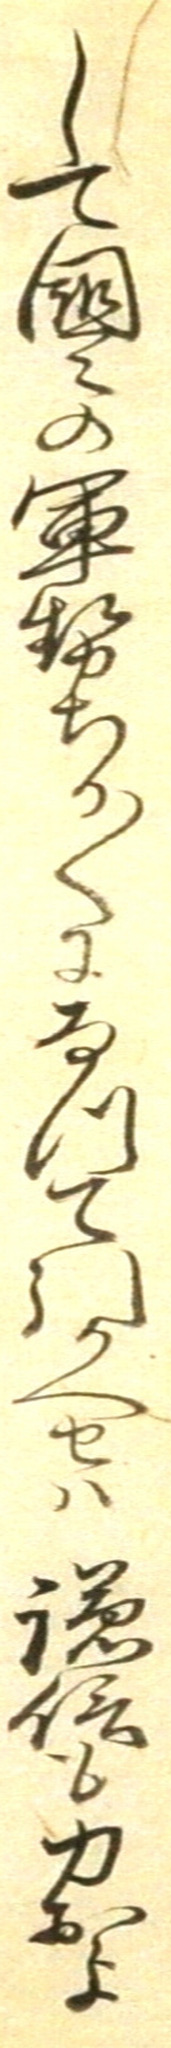して国々の軍勢ちかくになつて引かへせは謙信も力およ
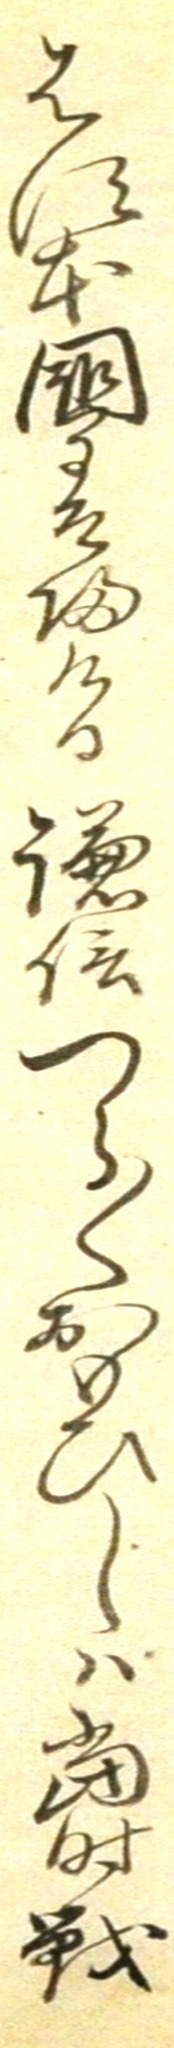はす本国にそ帰ける謙信つら〳〵おもひしかは当時戦
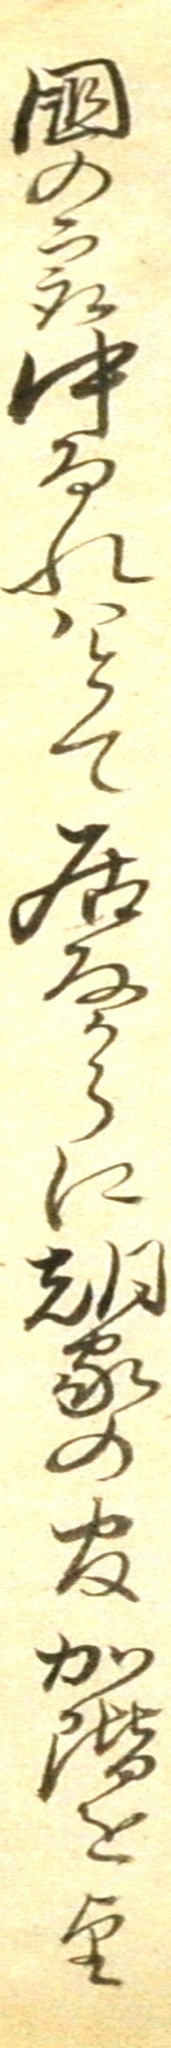国の最中なれはとて居なからに朝家の官加階を望
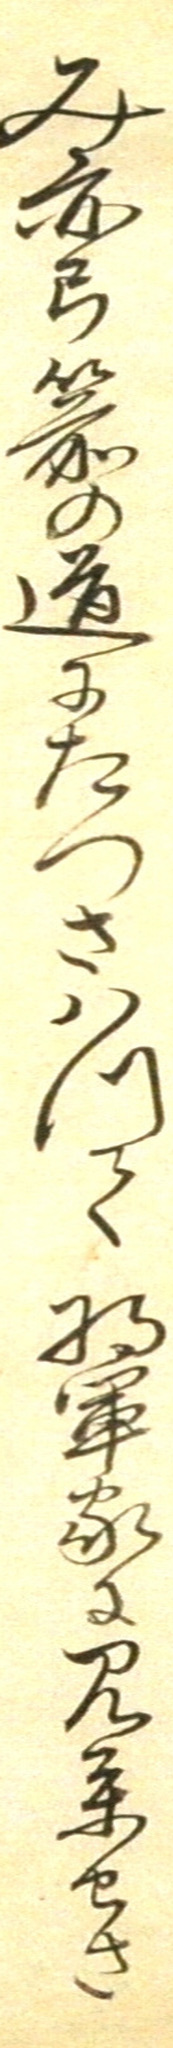み亦弓箭の道にたつさはつて将軍家に見参せさ
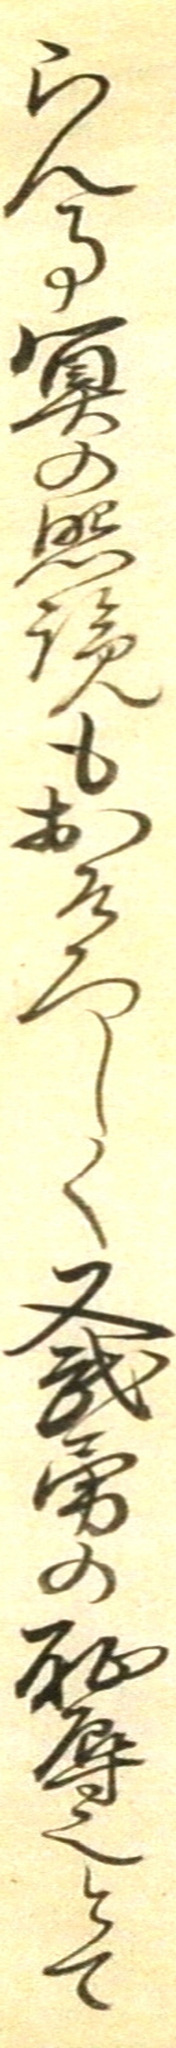らん事冥の照覧もおそろしく又武勇の恥辱也とて
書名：藩翰譜（八・下）
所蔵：伊那市立高遠町図書館・合同会社AMANE
